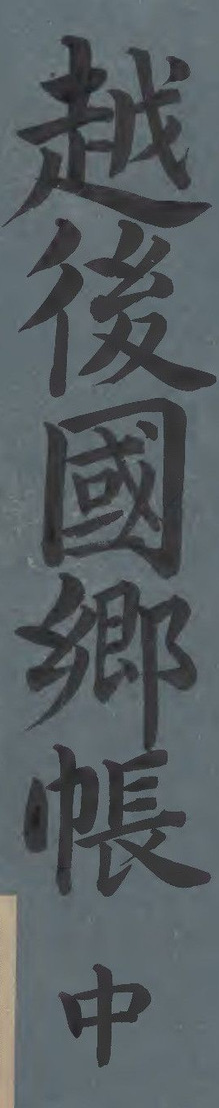越後国郷帳中

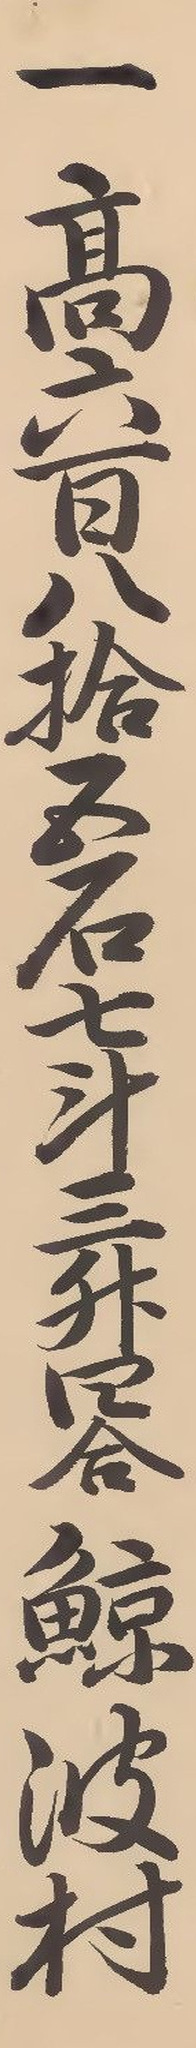一高六百八拾五石七斗三升四合鯨波村
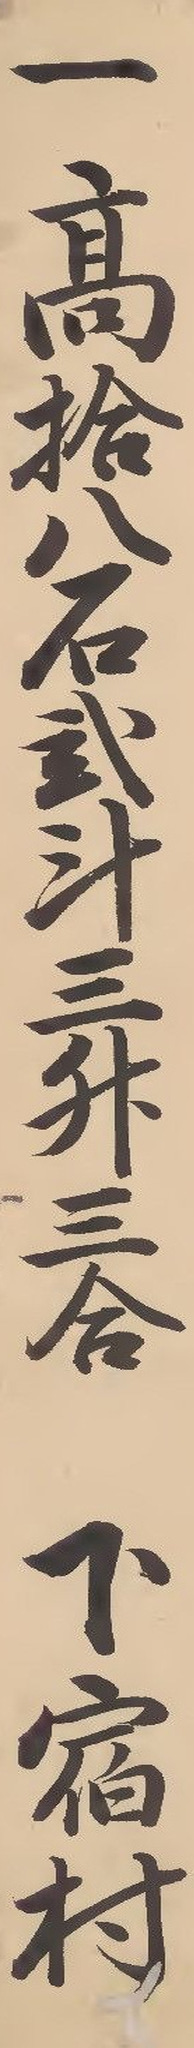一高拾八石弐斗三升三合下宿村

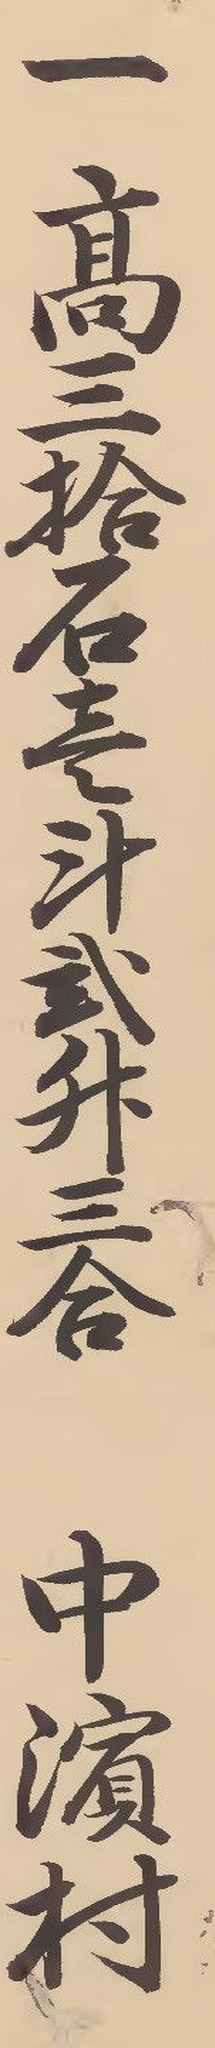一高三拾石壱斗弐升三合中浜村
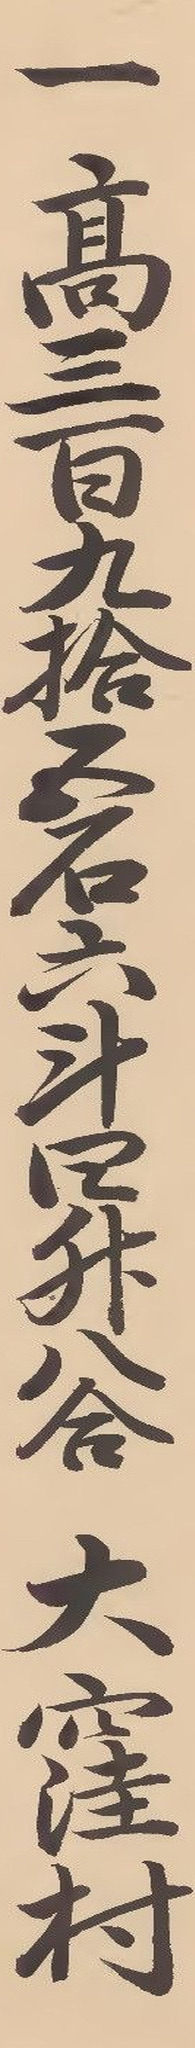一高三百九拾五石六斗四升八合大窪村
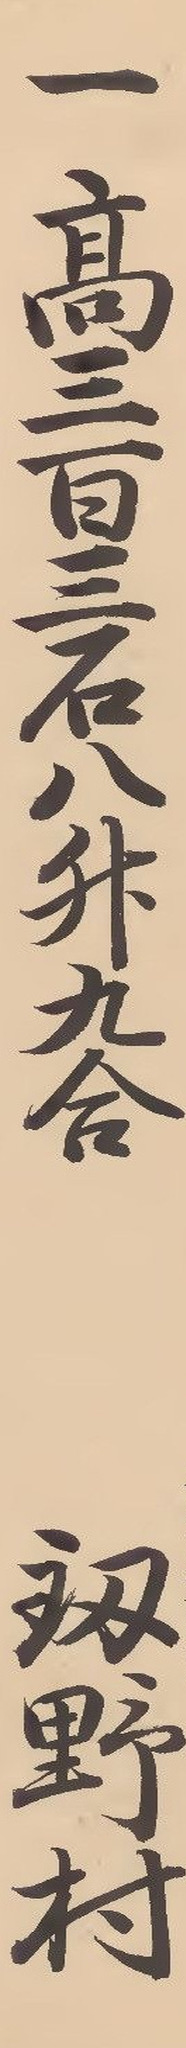一高三百三石八升九合剣野村
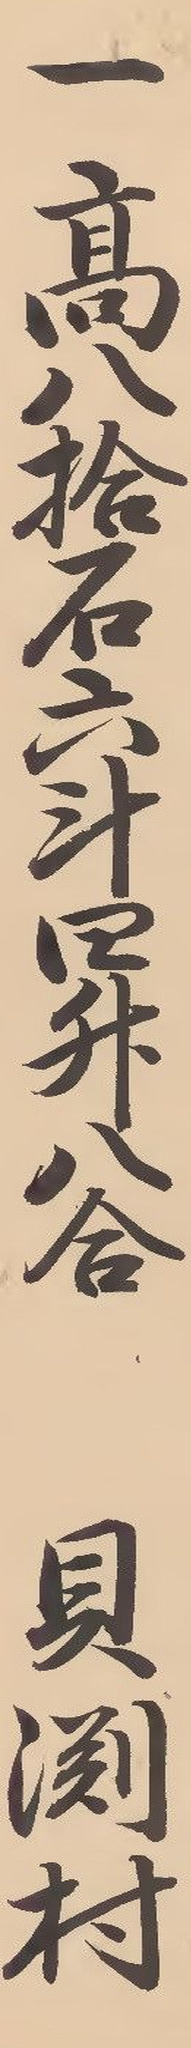一高八拾石六斗四升八合貝渕村
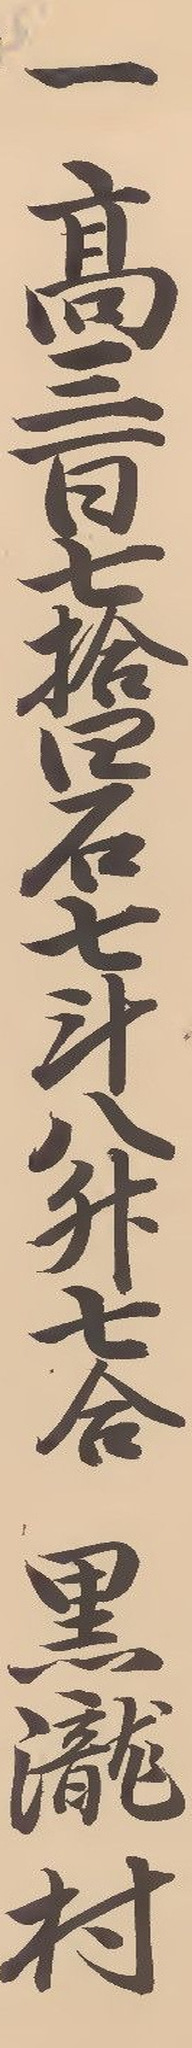一高三百七拾四石七斗八升七合黒滝村
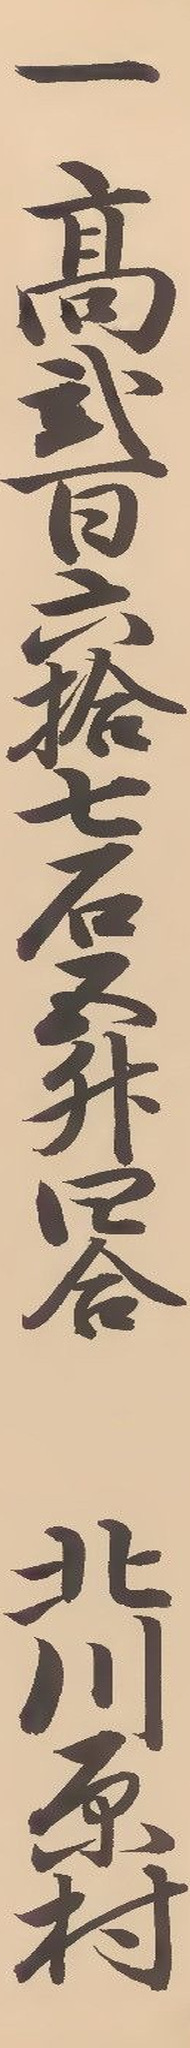一高弐百六拾七石五升四合北川原村
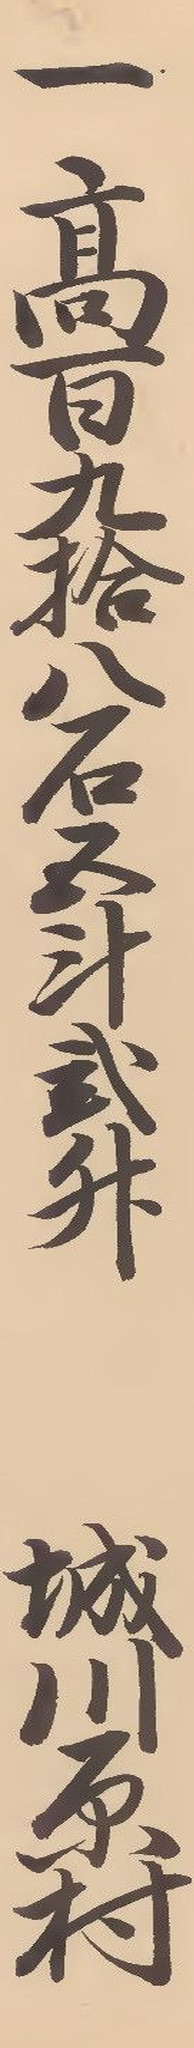一高百九拾八石五斗弐升城川原村
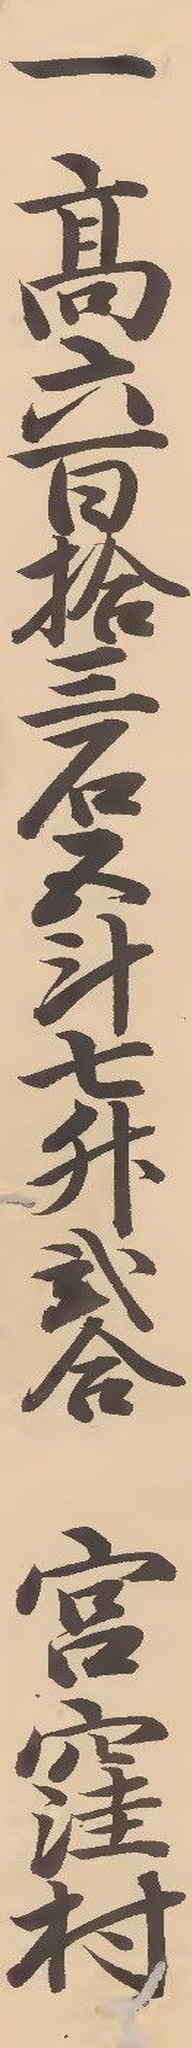一高六百拾三石五斗七升弐合宮窪村

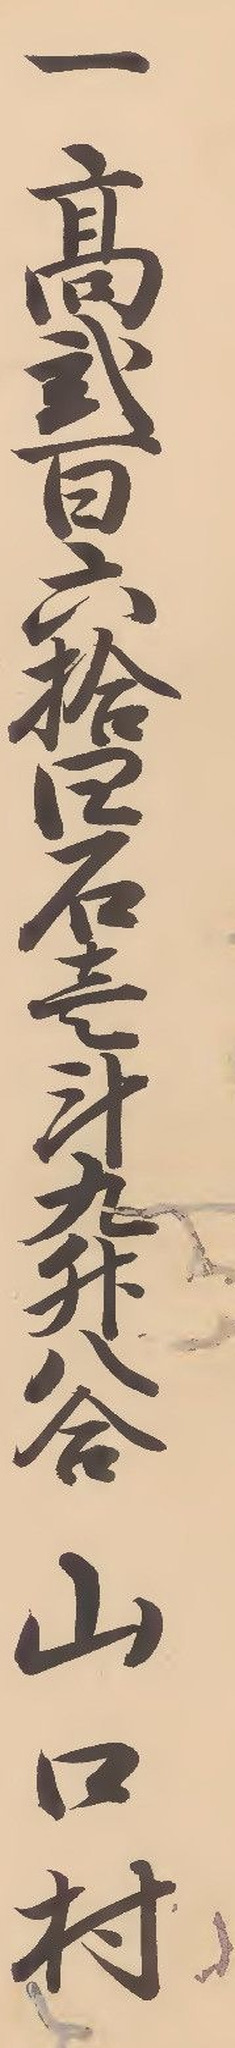一高弐百六拾四石壱斗九升八合山口村
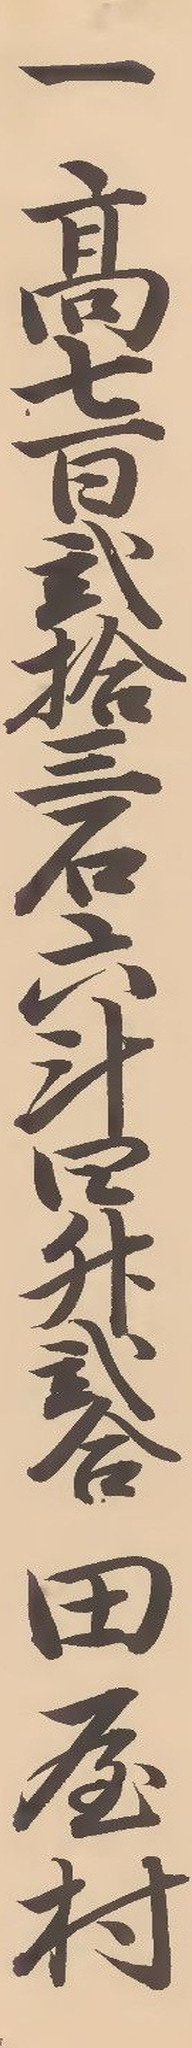一高七百弐拾三石六斗四升弐合田屋村
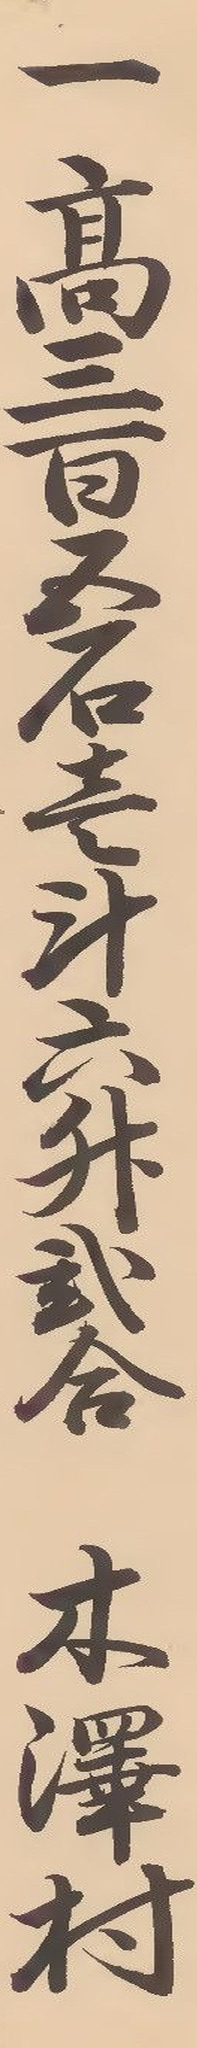一高三百五石壱斗六升弐合木沢村
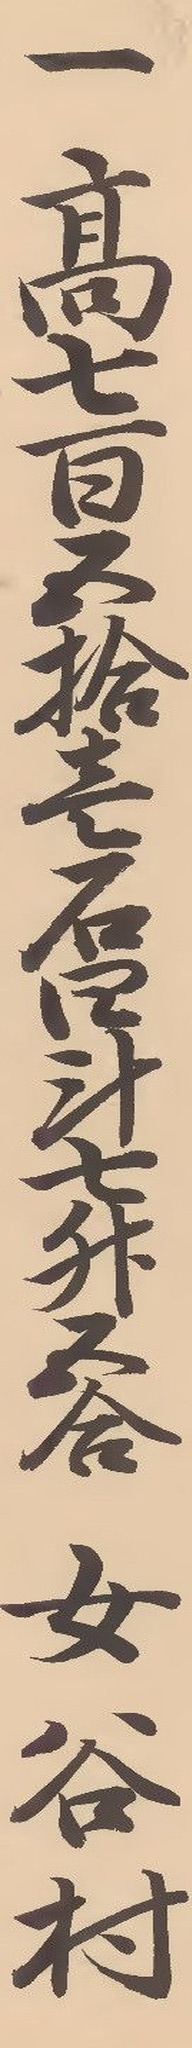一高七百五拾壱石四斗七升五合女谷村
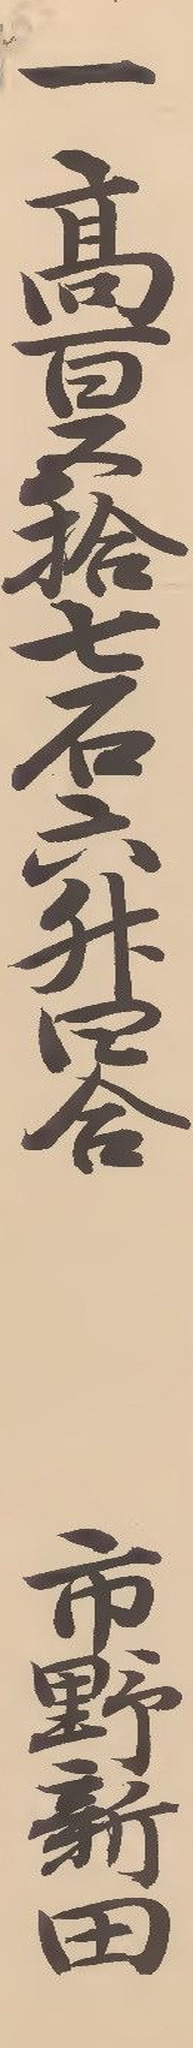一高百五拾七石六升四合市野新田
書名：越後国郷帳　中
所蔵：国立公文書館 National Archives of Japan
